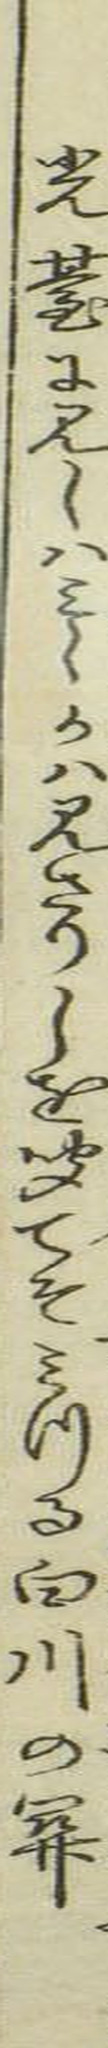光臺に見しはみしかは見さりしを聞てそみつる白川の關

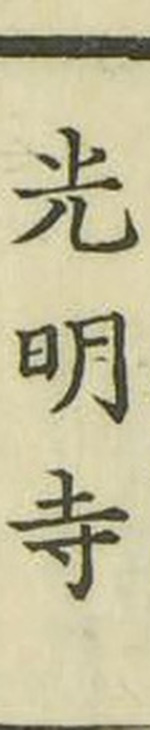光明寺

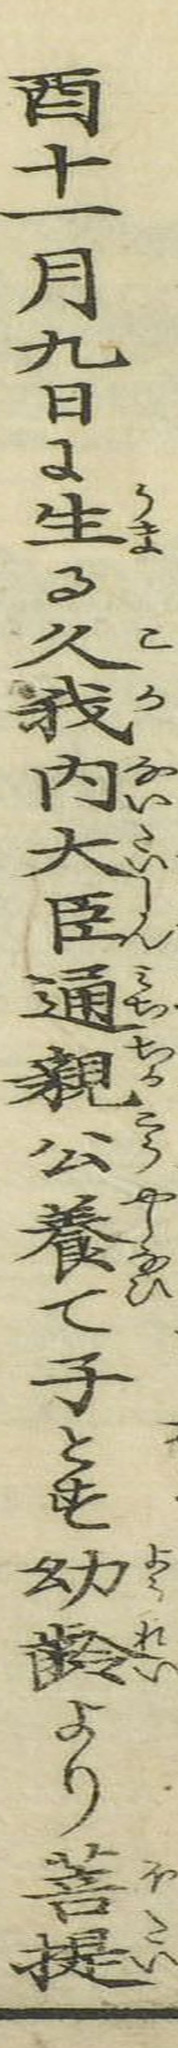酉十一月九日に生る久我内大臣通親公養て子とす幼齢より菩提
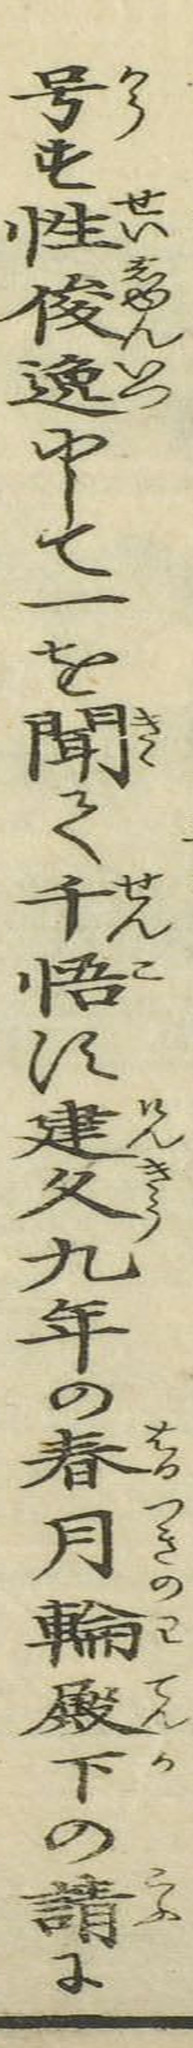号す性俊逸にして一を聞て千悟す建久九年の春月輪殿下の請に
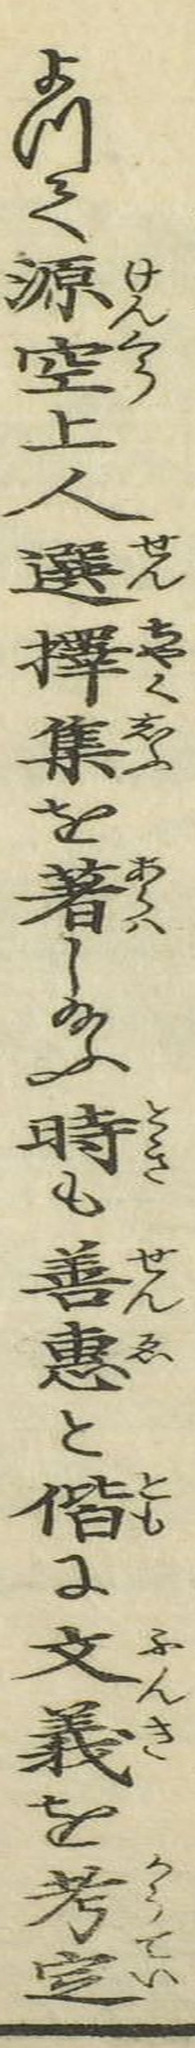よつて源空上人選擇集を著し給ふ時も善惠と偕に文義を考定
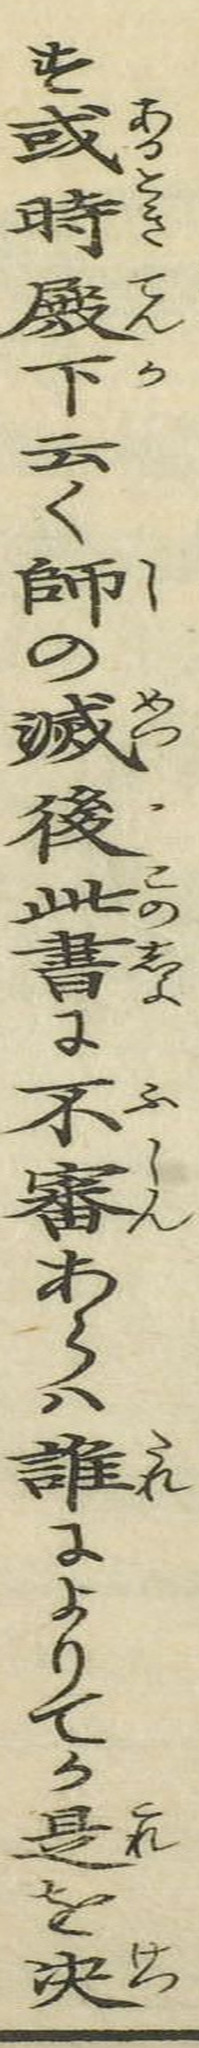す或時殿下云く師の滅後此書に不審あらは誰によりてか是を決
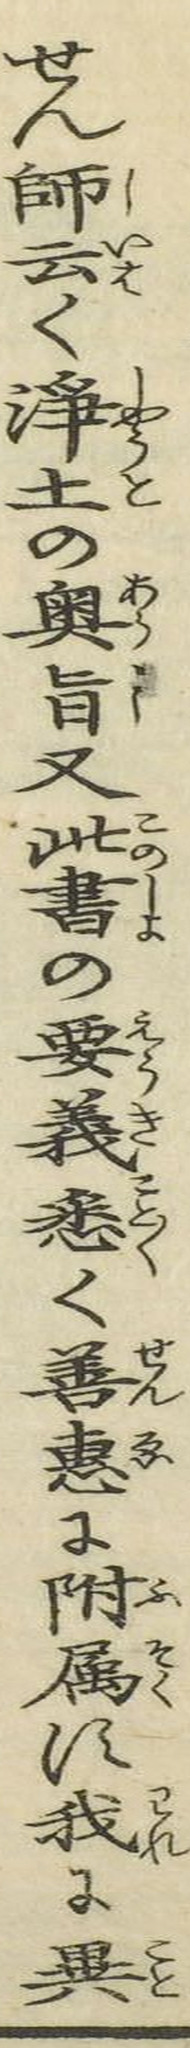せん師云く浄土の奥旨又此書の要義悉く善惠に附属す我に異
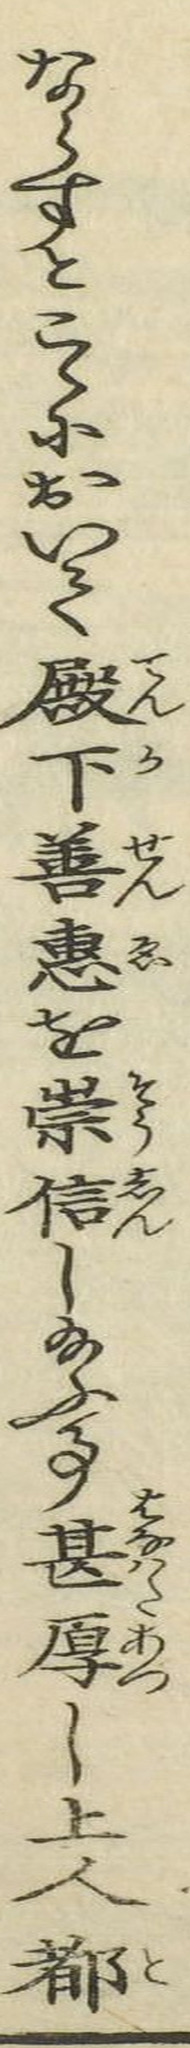ならすとこゝにおいて殿下善惠を崇信し給ふ事甚厚し上人都
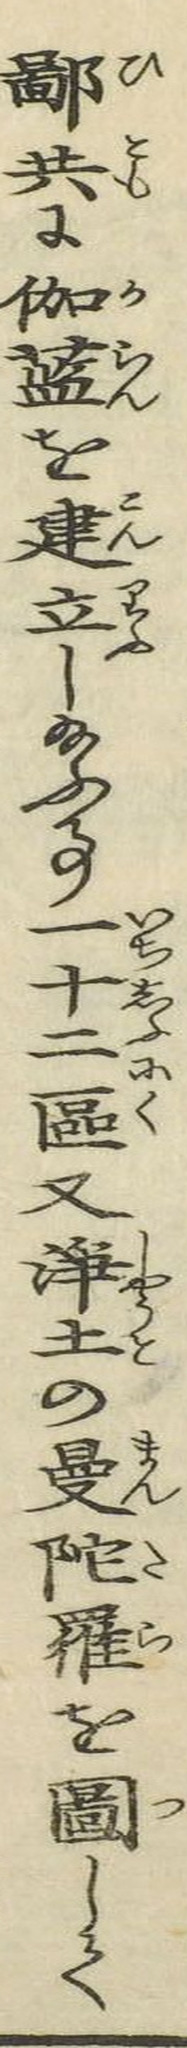鄙共に伽藍を建立し給ふ事一十二區又淨土の曼荼羅を圖して
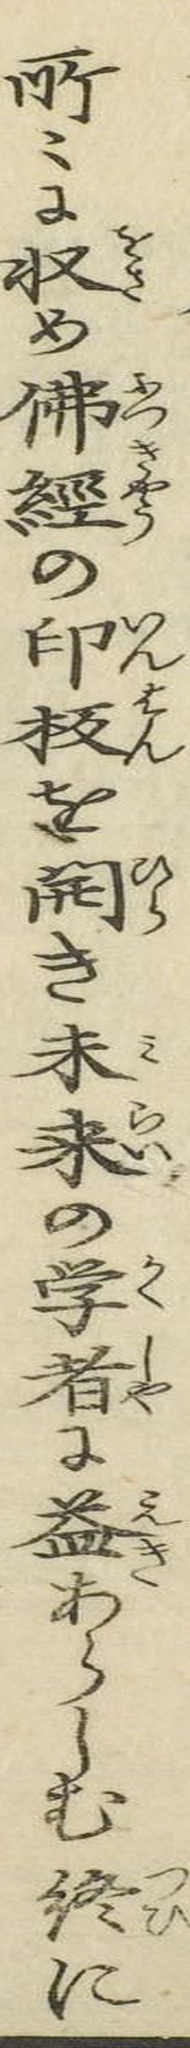所々に収め佛經の印板を開き未来の学者の益あらしむ終に
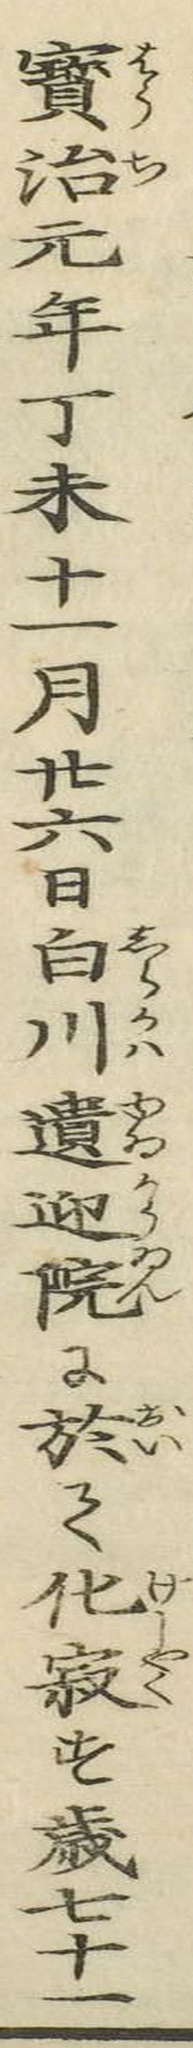寳治元年丁未十一月廿六日白川遺迎院に於て化寂す歳七十一
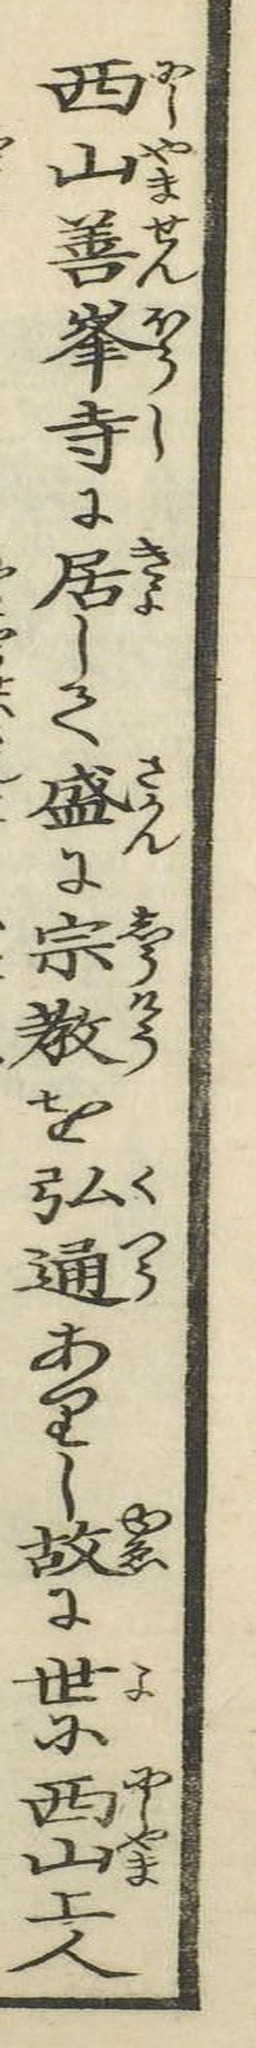西山善峯寺に居して盛に宗教を弘通ありし故に世に西山上人
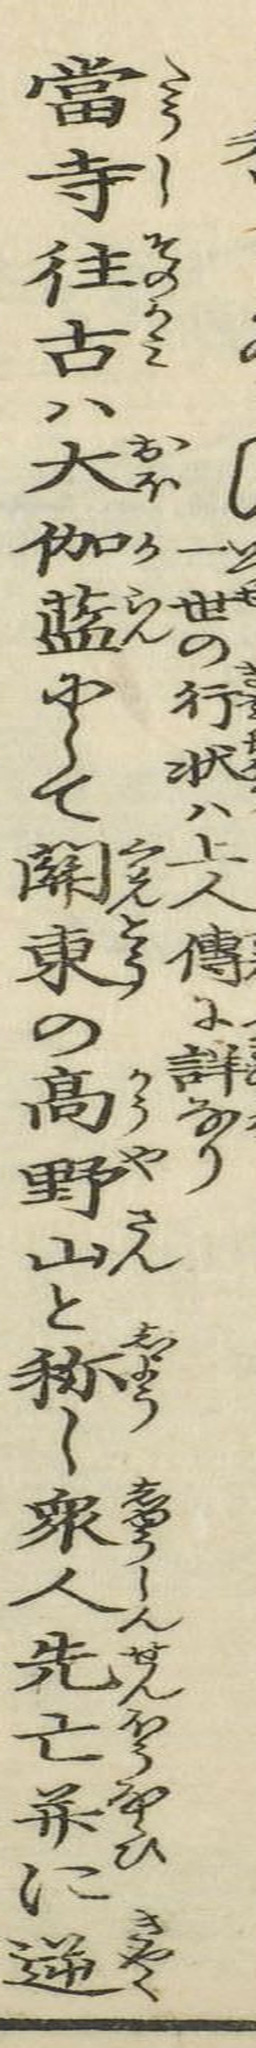當寺往古は大伽藍にして關東の高野山と称し衆人先亡幷に逆
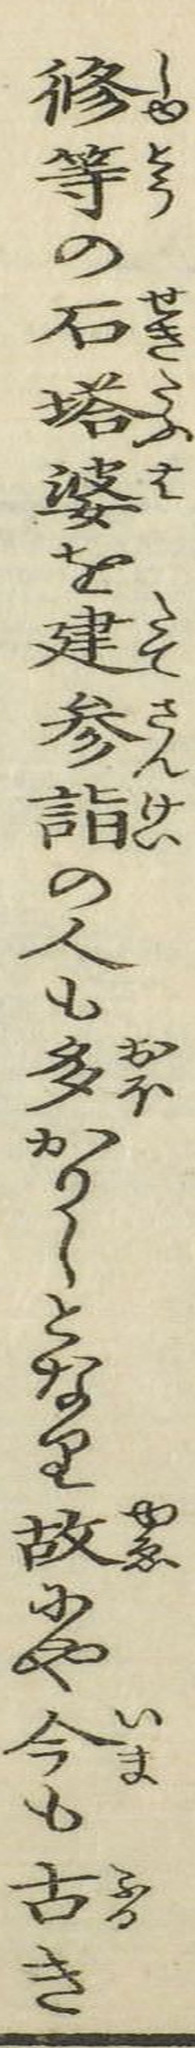修等の石塔婆を建参詣の人も多かりしとなり故にや今も古き
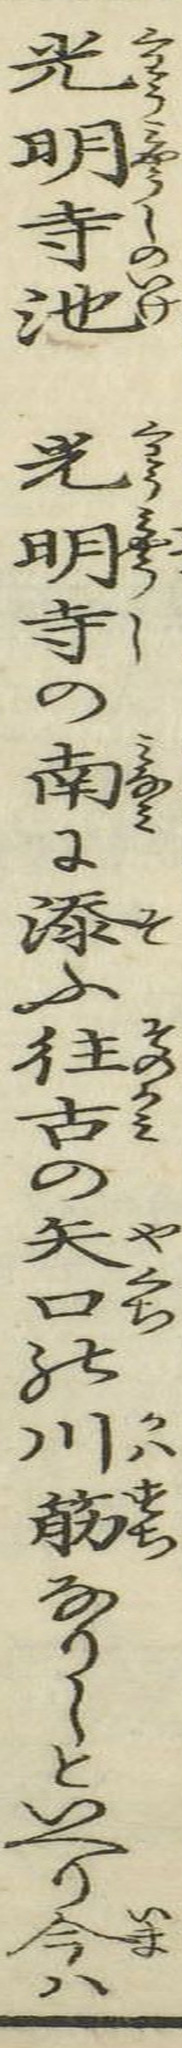光明寺池光明寺の南に添ふ往古の矢口の川筋なりしといへり今は
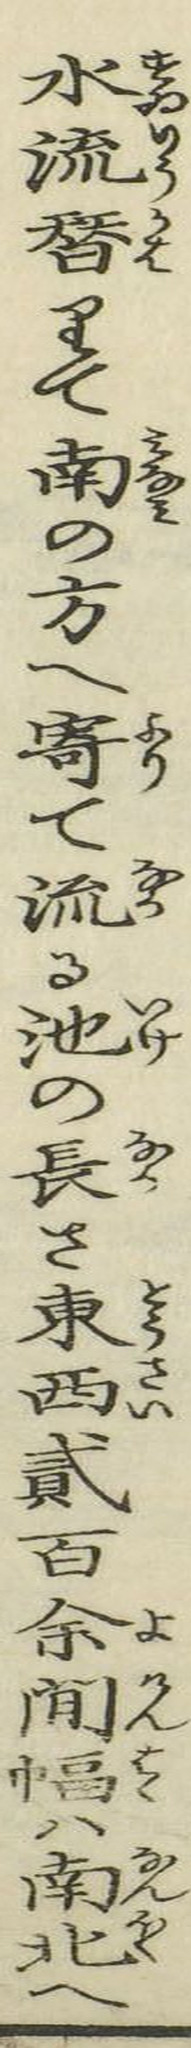水流替りて南の方へ寄て流る池の長さ東西貮百余間幅は南北へ
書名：江戸名所図会 20巻 巻之4
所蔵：東京学芸大学教育コンテンツアーカイブ
